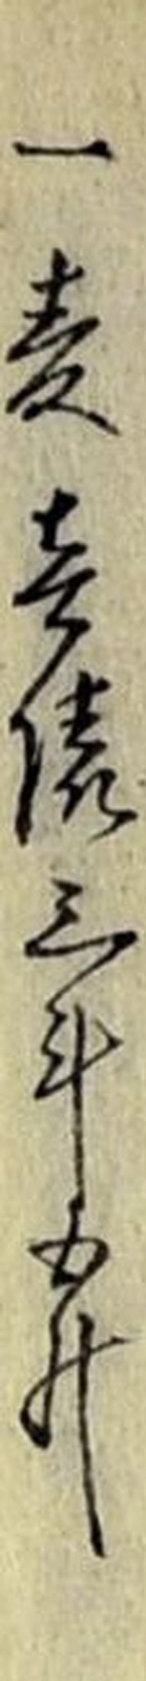一麦壱俵三斗五升
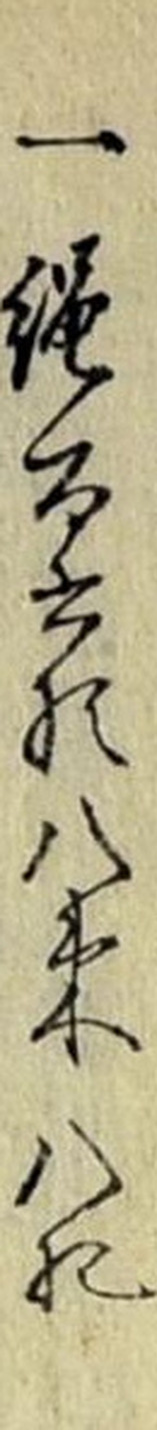一縄百六拾八束八把
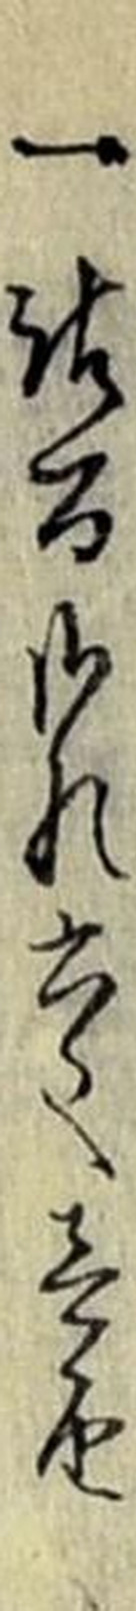一銀百弐拾六匁壱厘
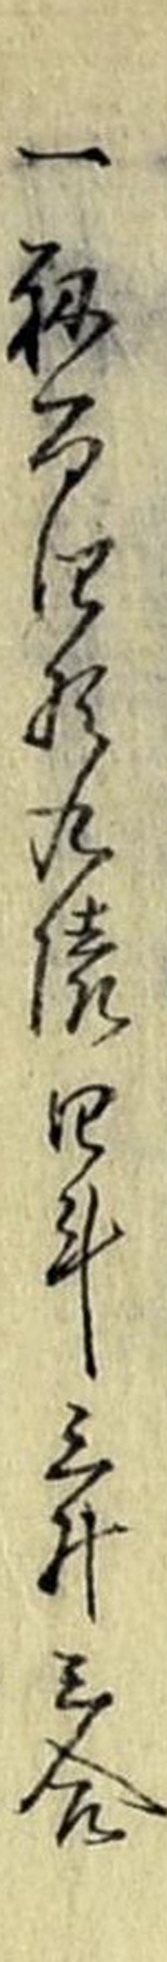一籾百四拾九俵四斗三升三合
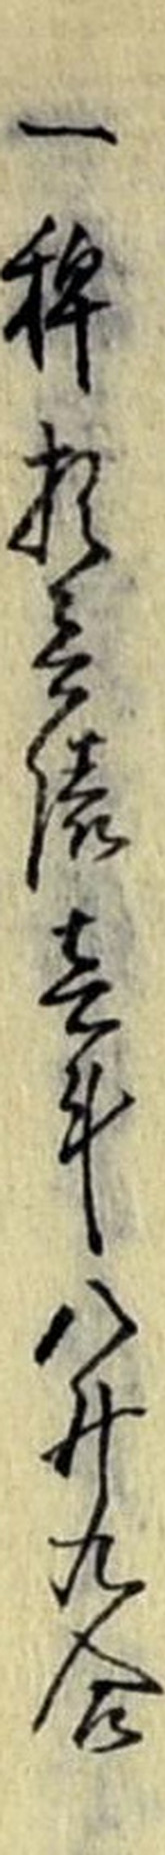一稗拾壱俵壱斗八升九合
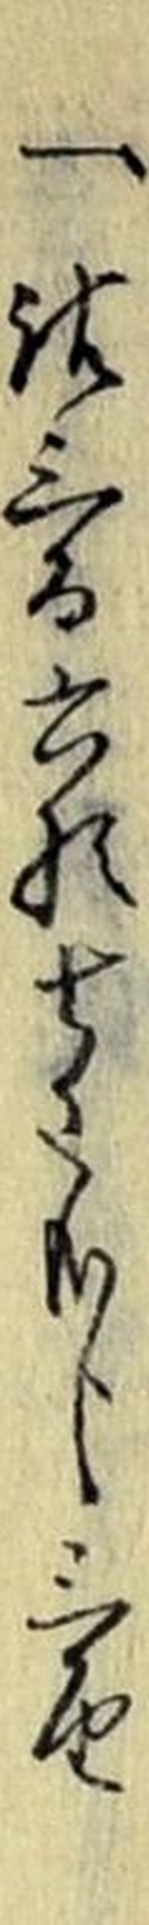一銀三百六拾七匁弐分三厘

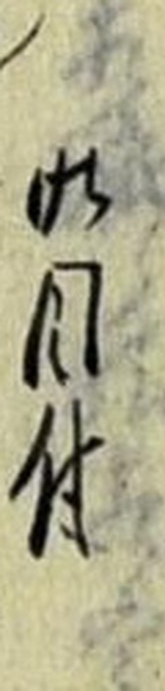御目付
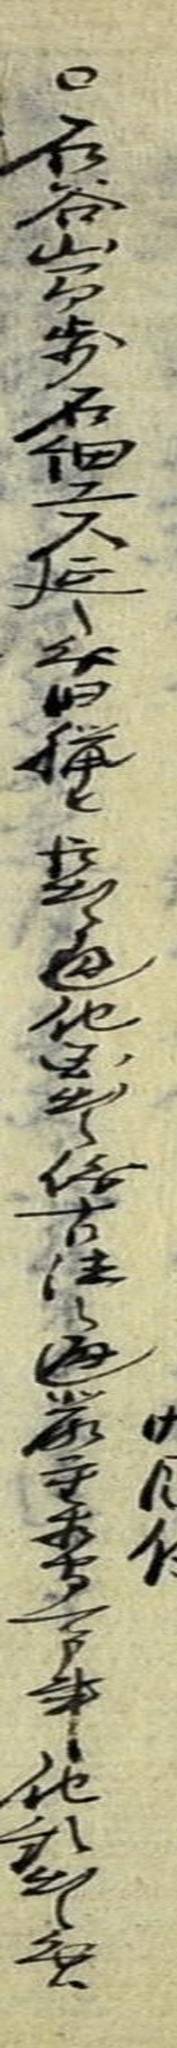○石谷山間歩石細工尺延之儀旧臘被仰出之通他国出之儀古法之通厳重相守可申事他領出之義ハ
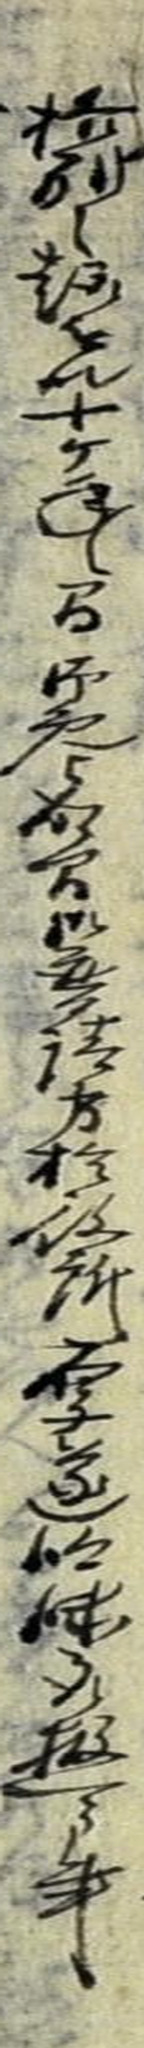格別之趣を以十ケ年之間御免被成候間御普請方於役所厚遂吟味取扱可申事
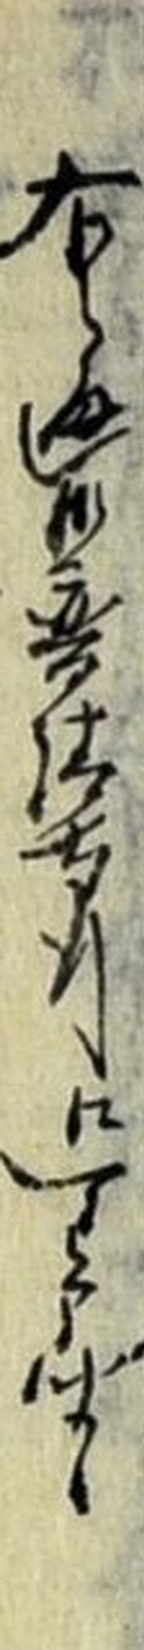右之通御普請奉行江可申聞候
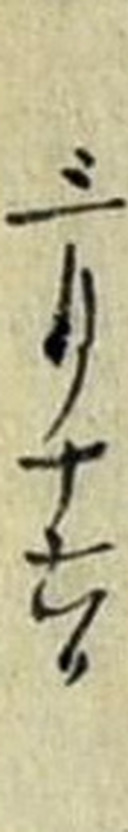三月十六日

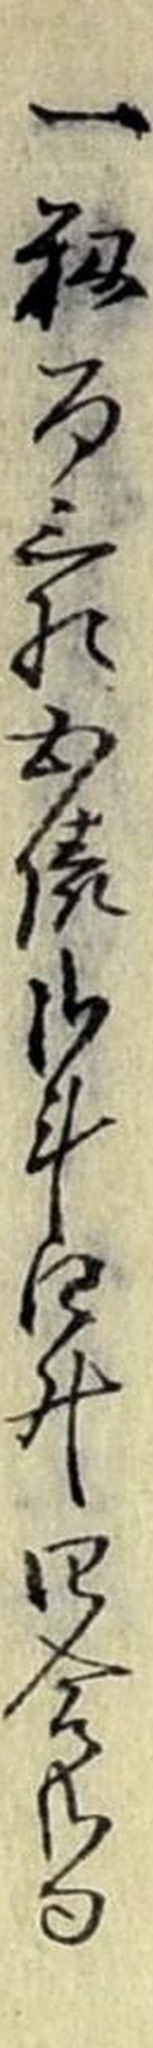一籾百三拾五俵弐斗四升四合弐勺
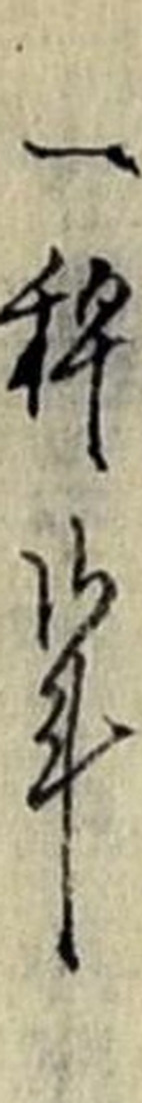一稗弐斗
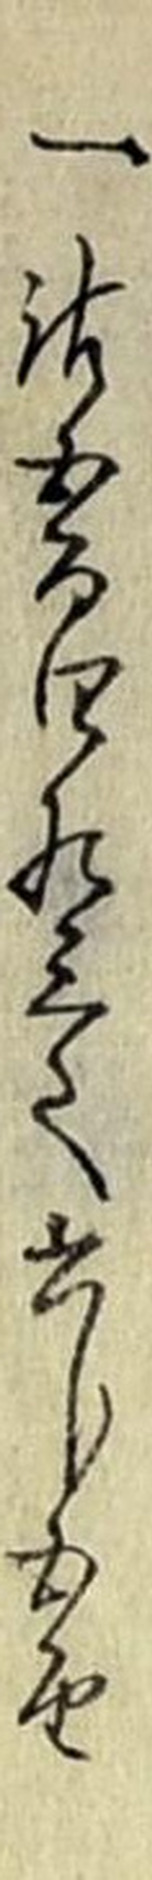一銀五百四拾三匁六分五厘
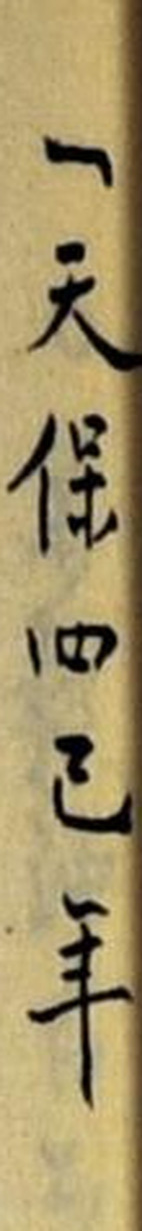一天保四巳年
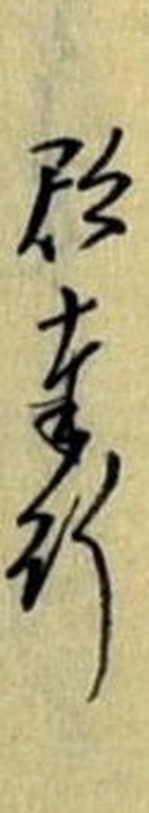郡奉行
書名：命令之部 五
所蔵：福井県文書館 Fukui Prefectural Archives
